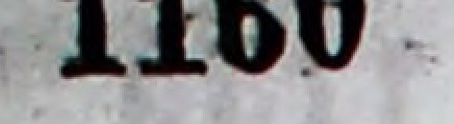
1160
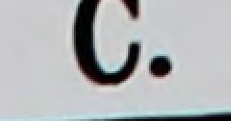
C.
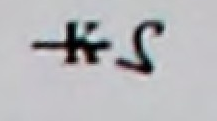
K S
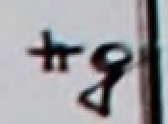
? G
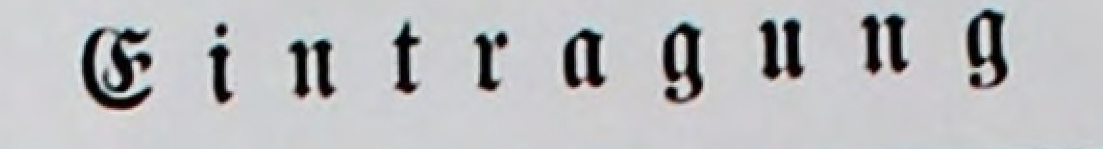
Eintragung
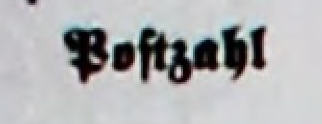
Postzahl
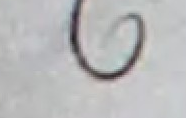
6
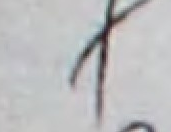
7
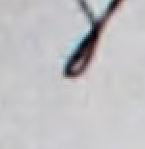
8
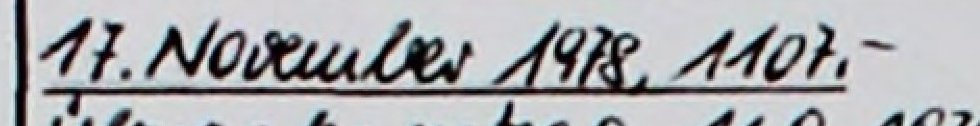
17. November 1978, 1107.-
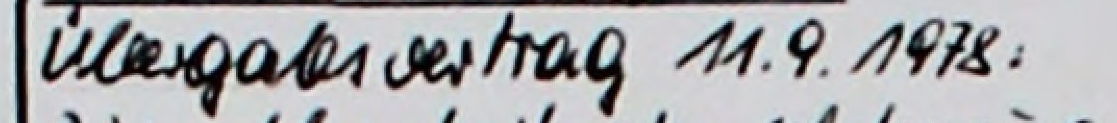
Übergabsvertrag 11.9.1978:
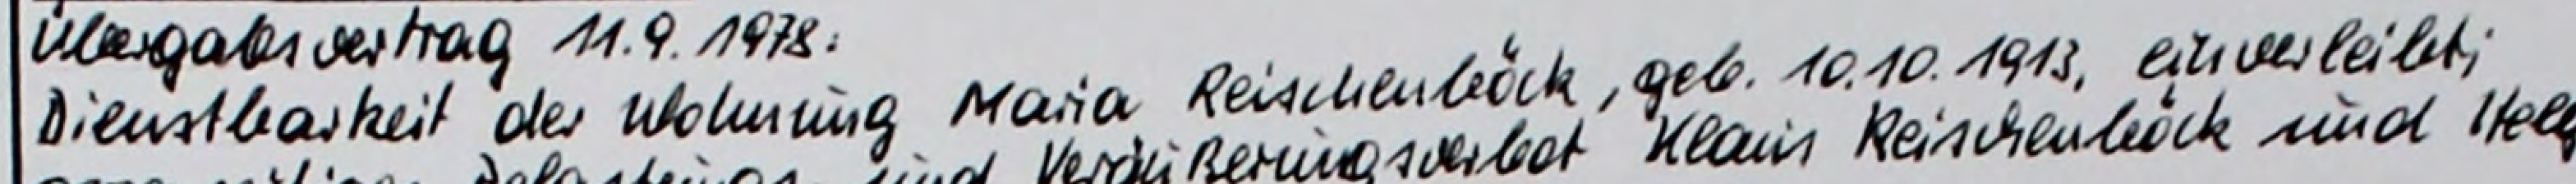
Dienstbarkeit der Wohnung Maria Reischenböck, geb. 10.10.1913, einverleibt;
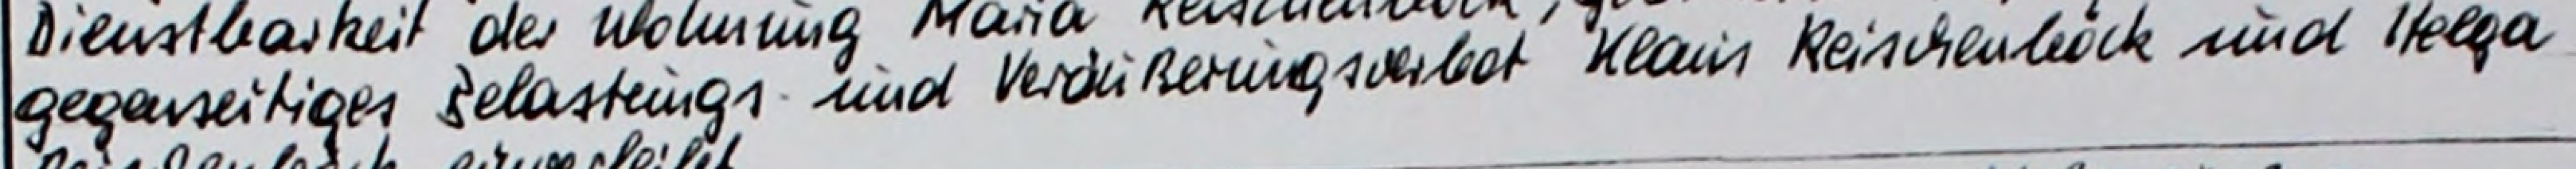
gega?sutiges Belastungs- und Veräußerungsverbot Klaus Reischenböck und Helga
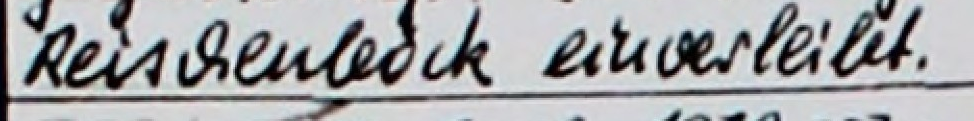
Reischenböck einverleibt.
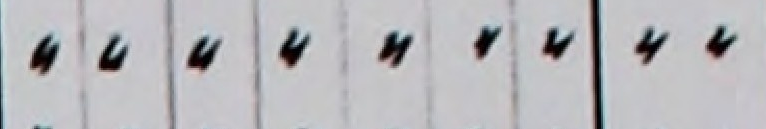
„„„„„„„„„
